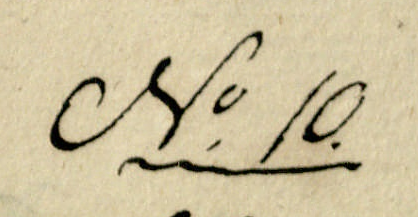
No 10.
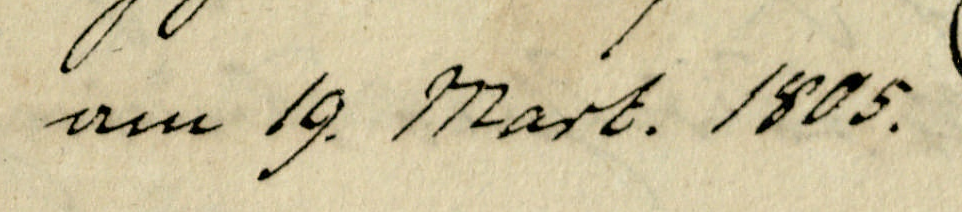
am 19. Mart. 1805.
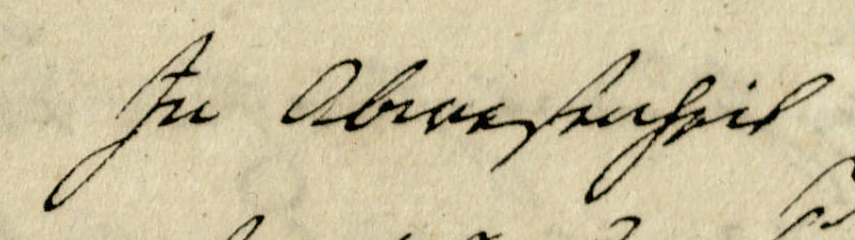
In Abwesenheit
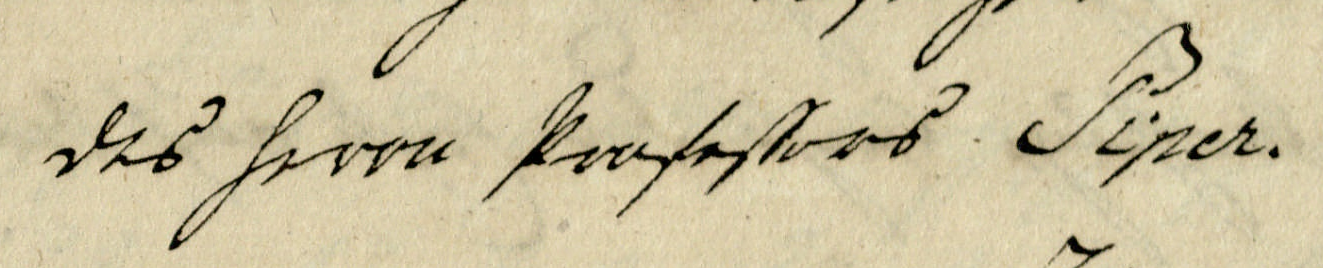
des Herrn Professors Piper.
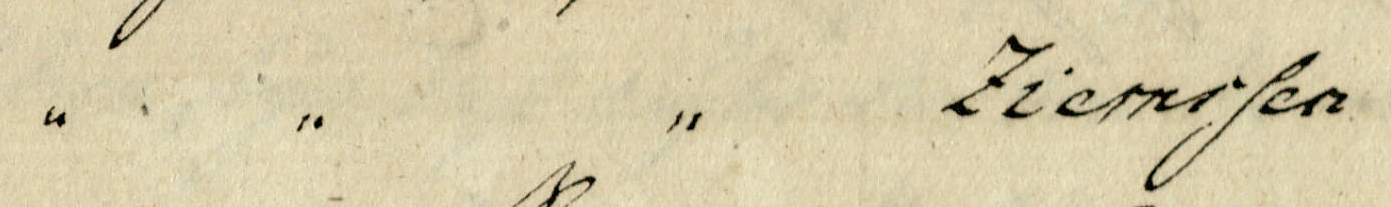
Ziemssen
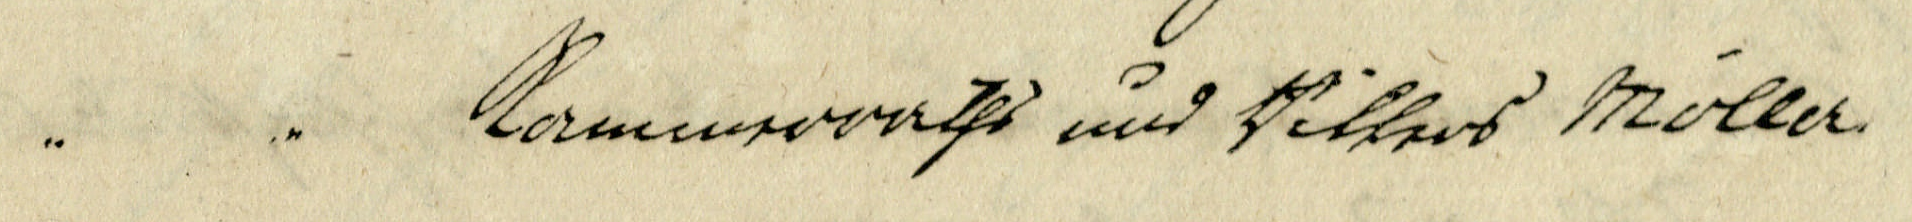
Kammerraths und Ritters Möller
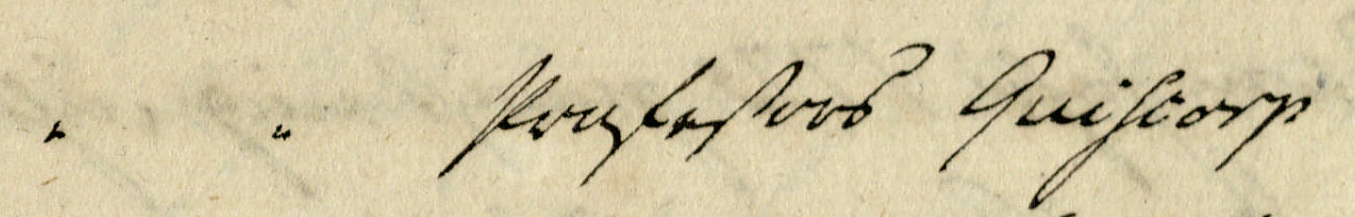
Professors Quistorp
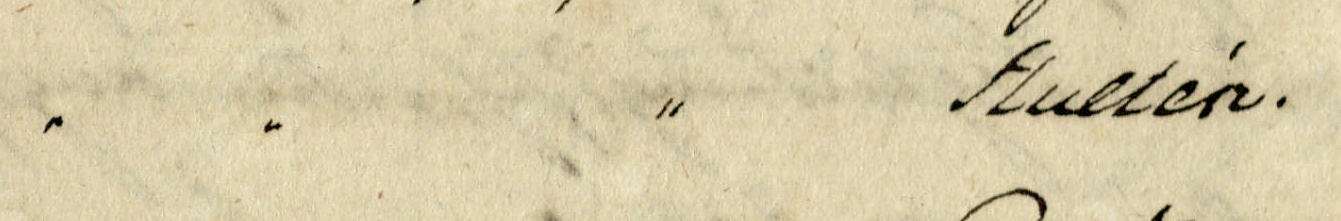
Hultén.
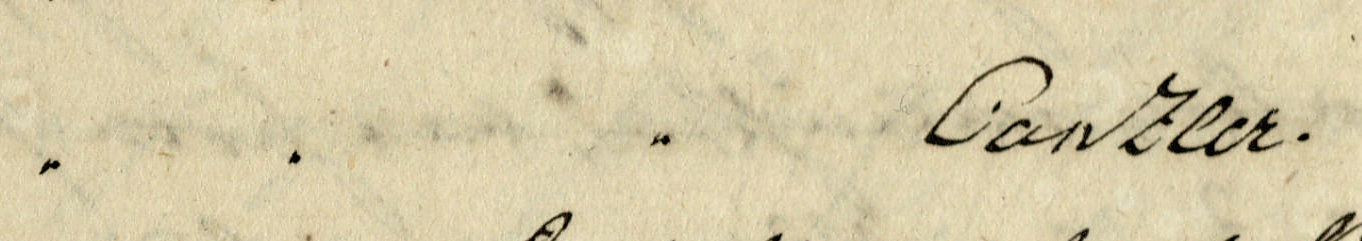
Canzler.
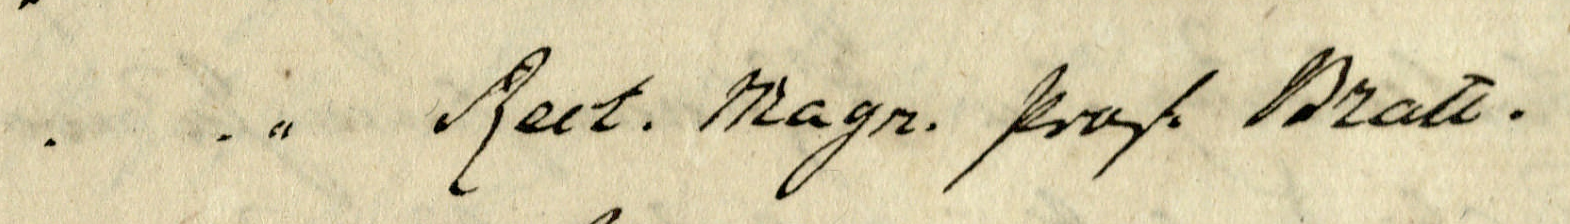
Rect. Magn. Prof. Bratt.
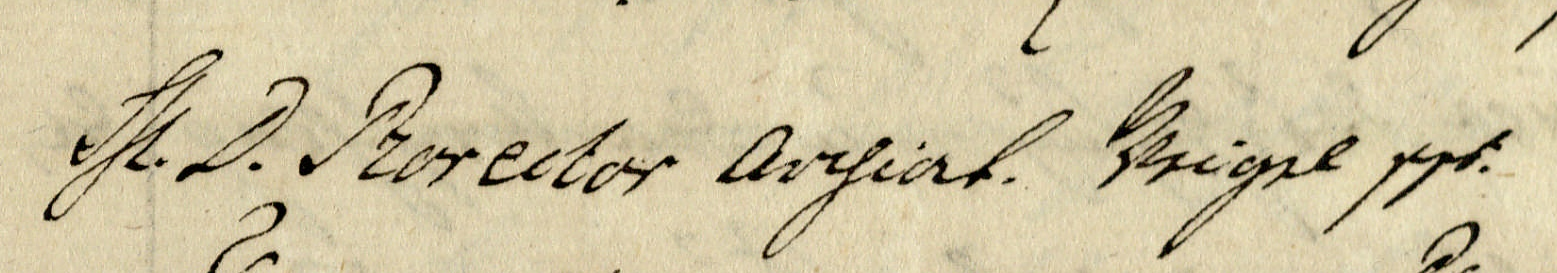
M. D. Prorector Archiat. Weigel ppt
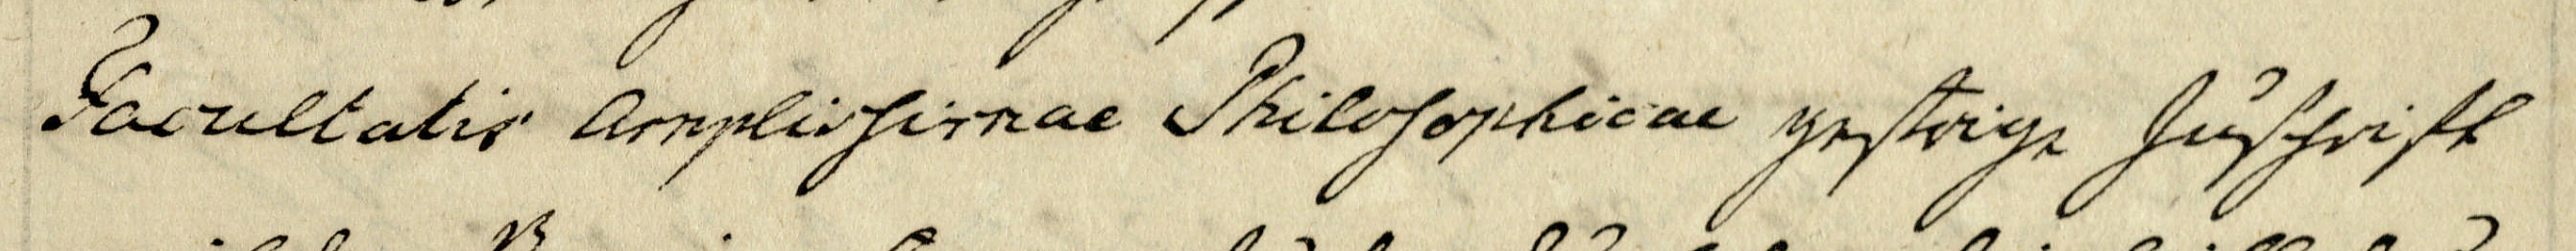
Facultatis Amplissimae Philosophicae gestrige Zuschrift
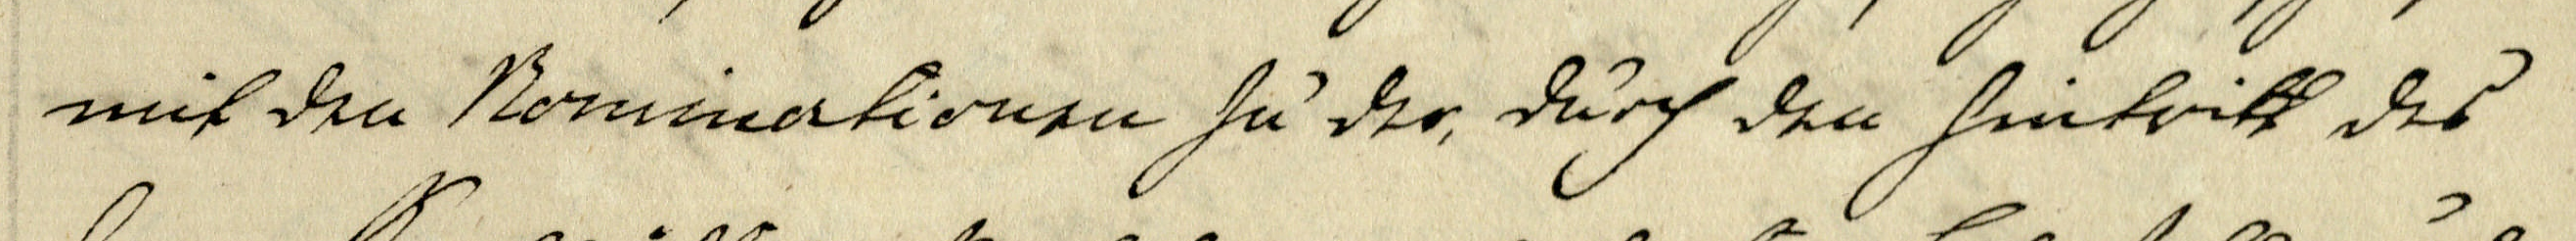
mit den Nominationen zu der durch den Hintritt des
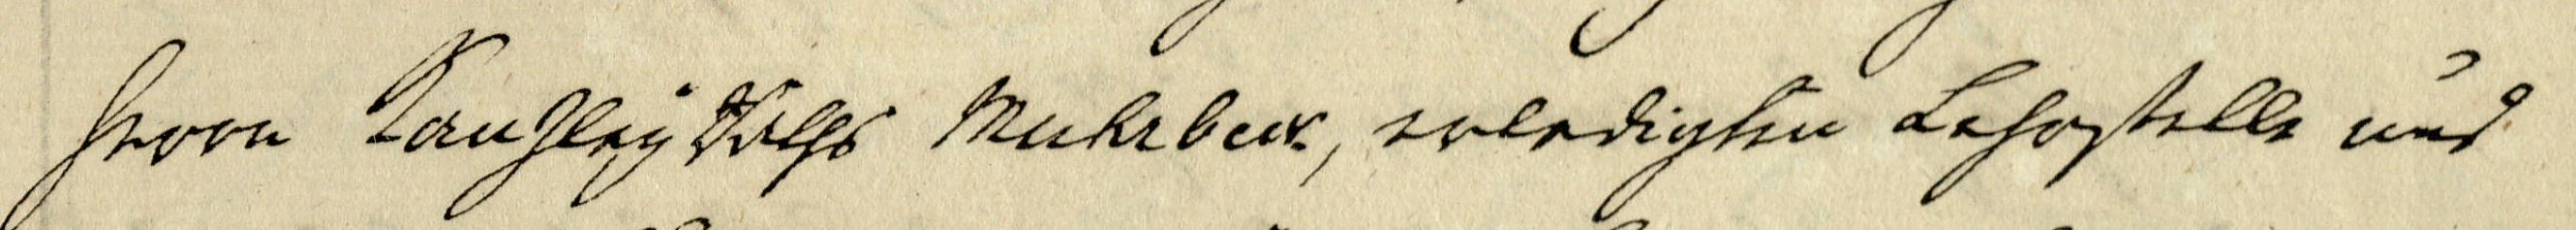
Herrn Kanzleÿ Raths Muhrbeck, erledigten Lehrstelle und
